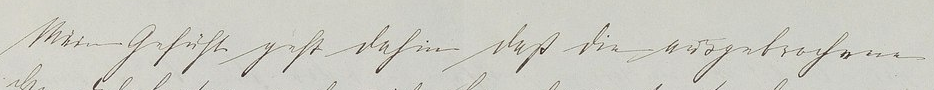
Mein Gefühl geht dahin daß die ausgebrochene
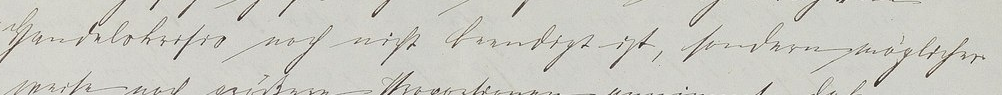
Handelskrisis noch nicht beendigt ist, sondern möglicher-
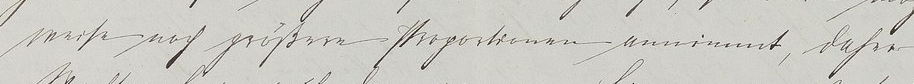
weise noch größere Proportionen annimmt, daher
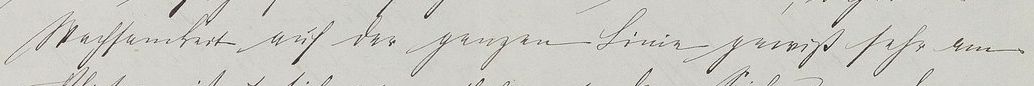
Wachsamkeit auf der ganzen Linie gewiß sehr am
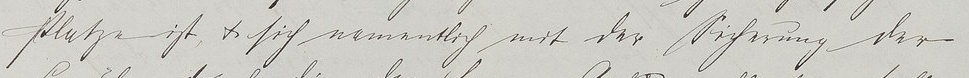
Platze ist, & sich namentlich mit der Sicherung der
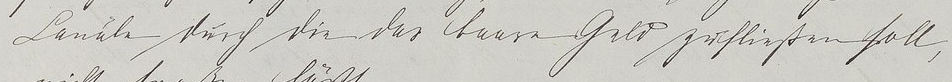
Canäle durch die das baare Geld zufließen soll,
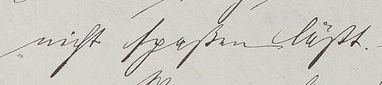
nicht spaßen läßt. –
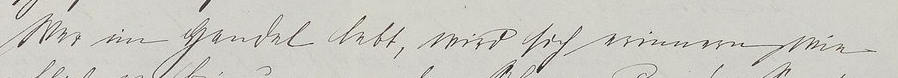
Wer im Handel lebt, wird sich erinnern wie
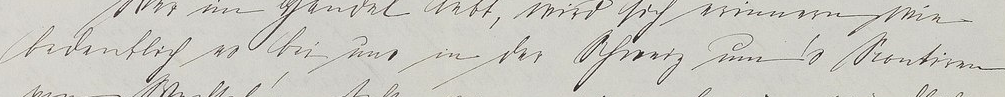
bedenklich es bei uns in der Schweiz um's Scontiren
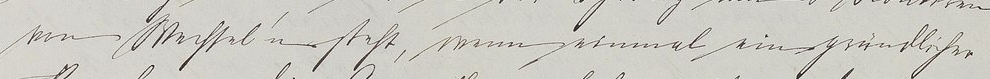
von Wechsel'n steht, wenn einmal ein gründlicher
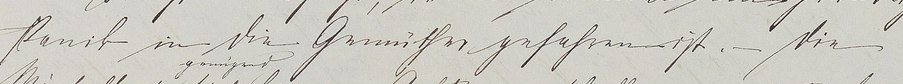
Panik in die Gemüther gefahren ist. – Die
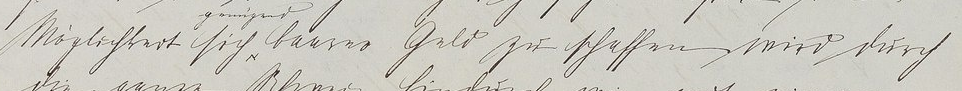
Möglichkeit sich genügend baares Geld zu schaffen wird durch
